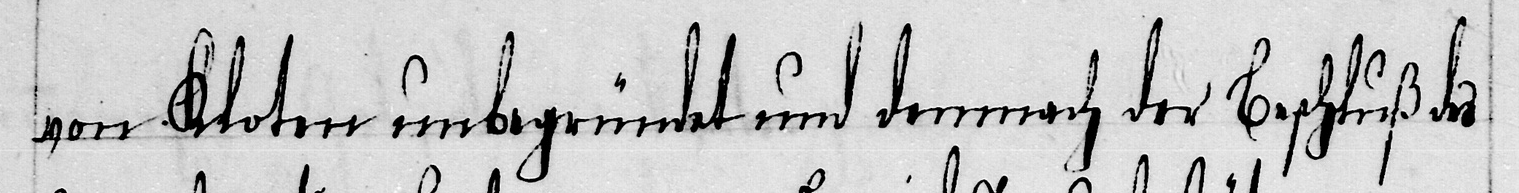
von Kloten unbegründet und demnach der Beschluß des
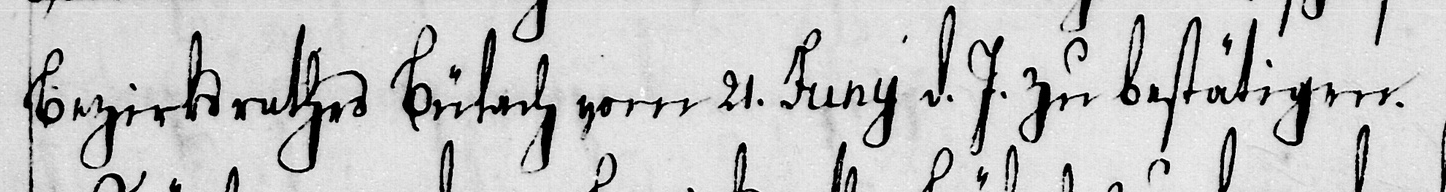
Bezirksrathes Bülach vom 21. Juny d. J. zu bestätigen.
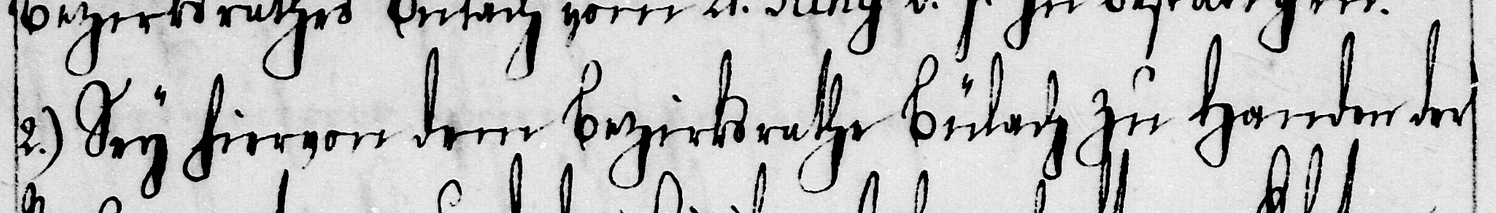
2.) Sey hiervon dem Bezirksrathe Bülach zu Handen der
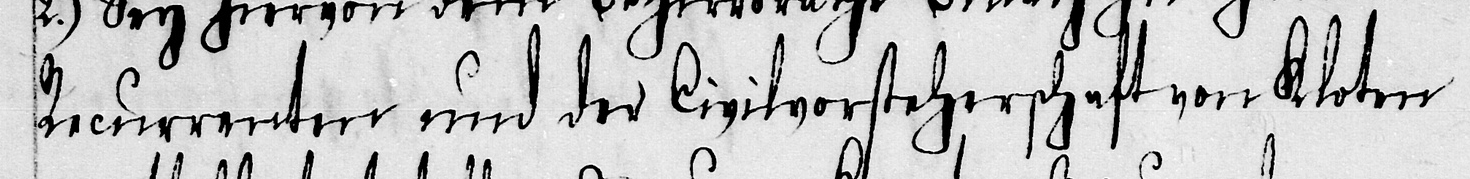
Recurrenten und der Civilvorsteherschaft von Kloten
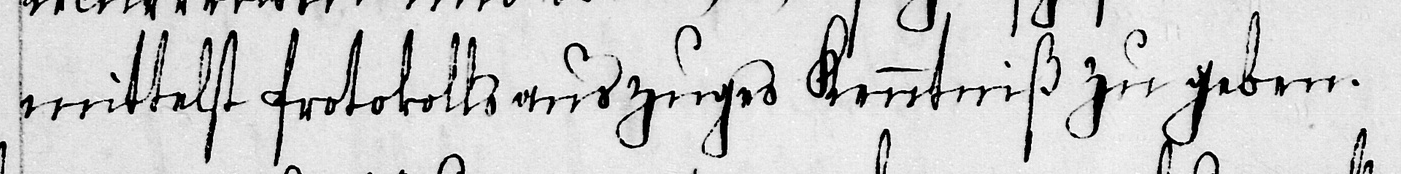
mittelst Protokollsauszuges Kenntniß zu geben.
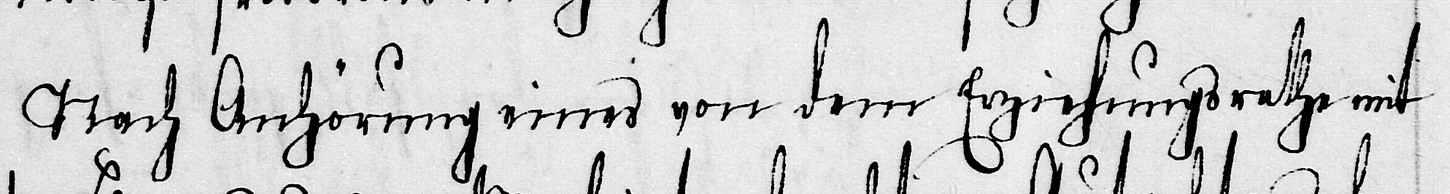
Nach Anhörung eines von dem Erziehungsrathe mit
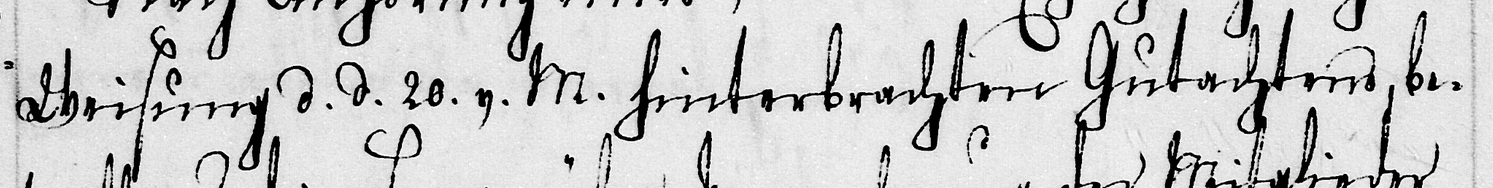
Weisung d. d. 20. v. M. hinterbrachten Gutachtens, be¬
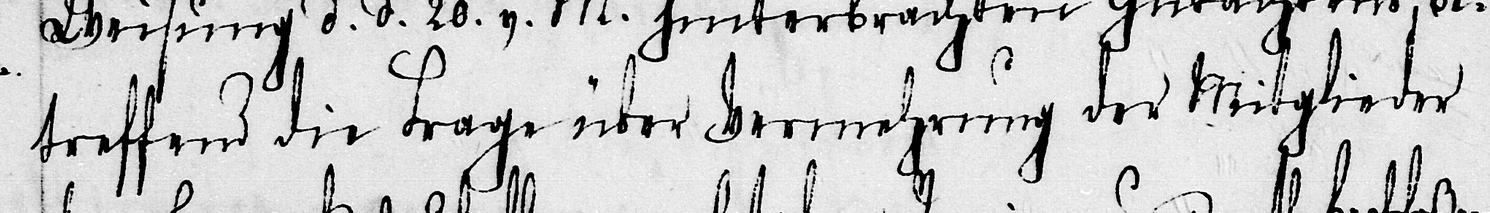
treffend die Frage über Vermehrung der Mitglieder
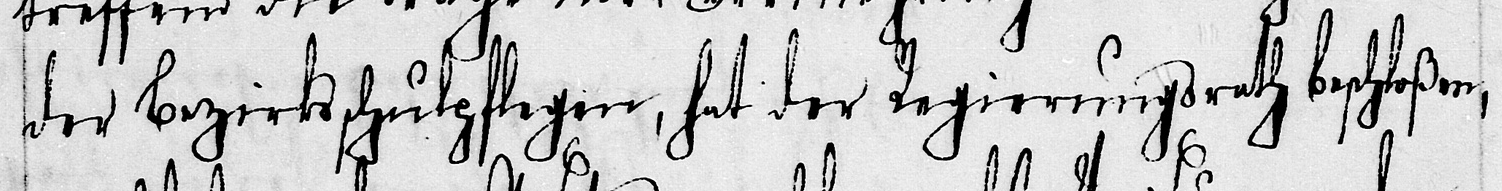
der Bezirksschulpflegen, hat der Regierungsrath beschloße¬
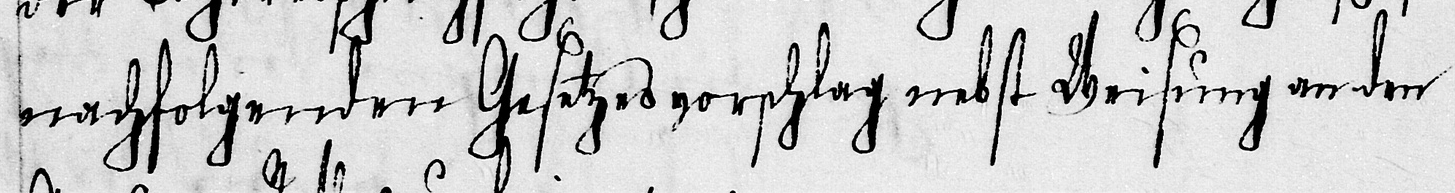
nachfolgenden Gesetzesvorschlag nebst Weisung an den
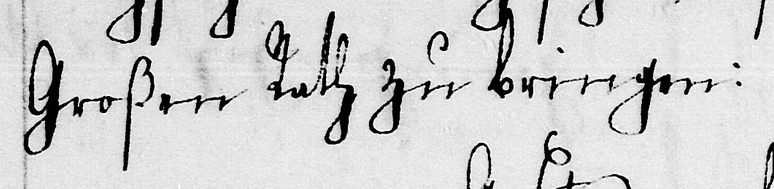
Großen Rath zu bringen:
